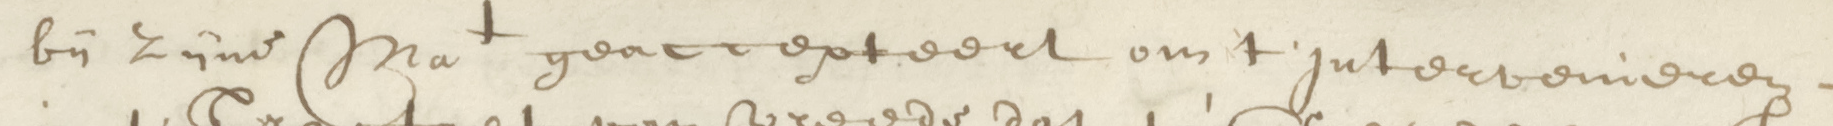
bij zijne Mat geaccepteert om 't intervenieren
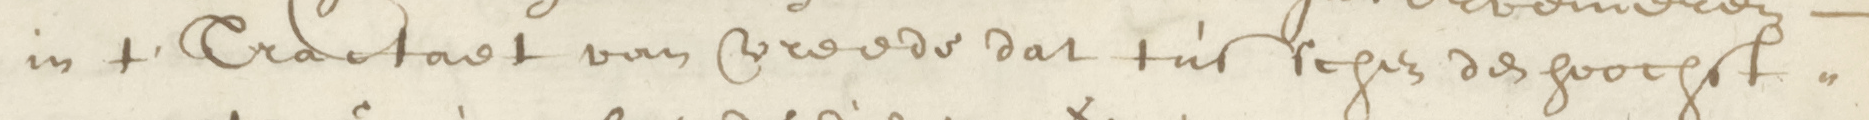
in t' Tractaet van vreede dat tusschen den hoochst„
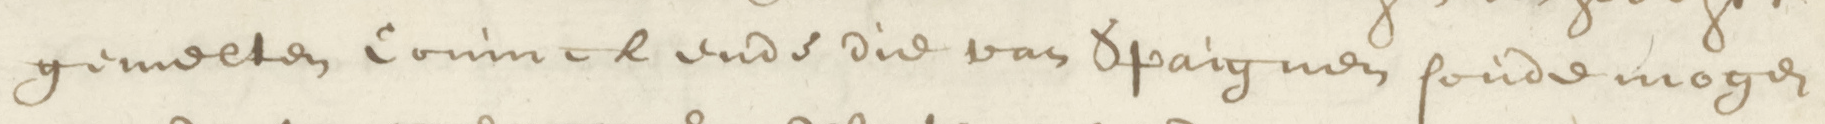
gemelten Coninck ende die van Spaignen soude mogen
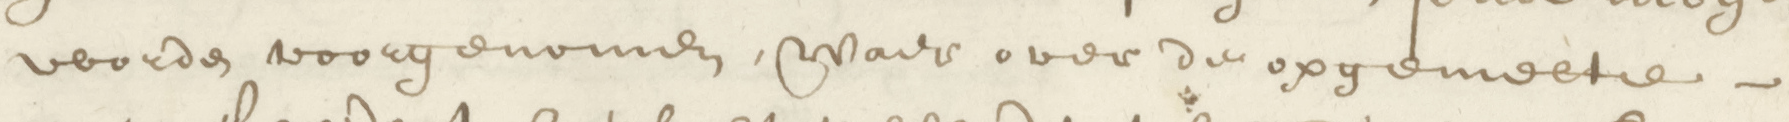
worden voorgenomen. Waer over de opgemelte -
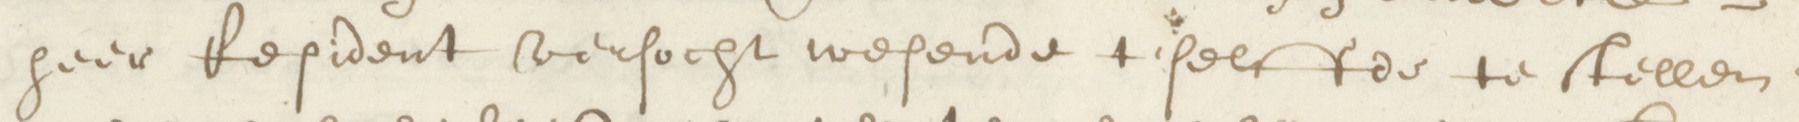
heer Resident versocht wesende t'selffde te stellen
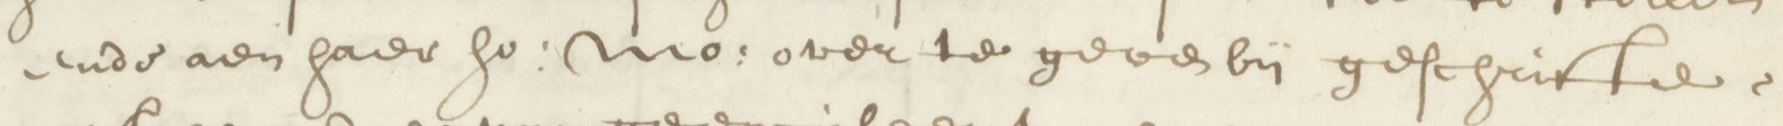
ende aen haer ho:Mo: over te geven bij geschrifte,
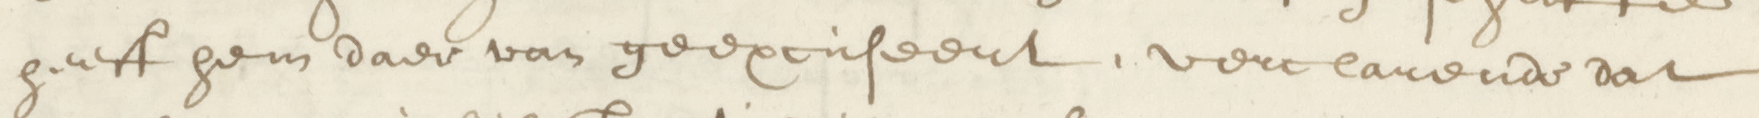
heeft hem daer van geexcuseert, verclarende dat
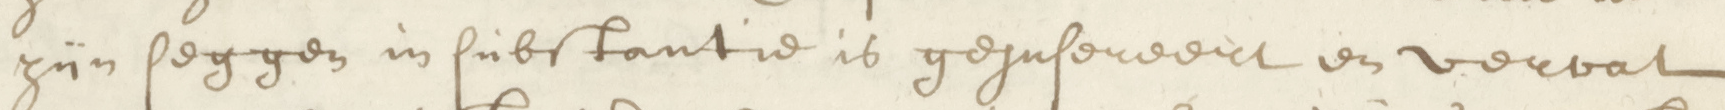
zijn seggen in substantie is geinsereert en vervat
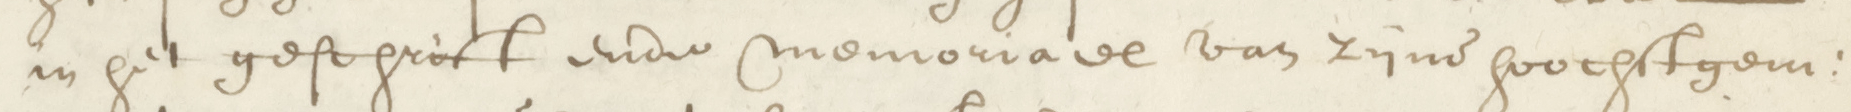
in het geschrift ende memoriael van zijne hoochstgem:
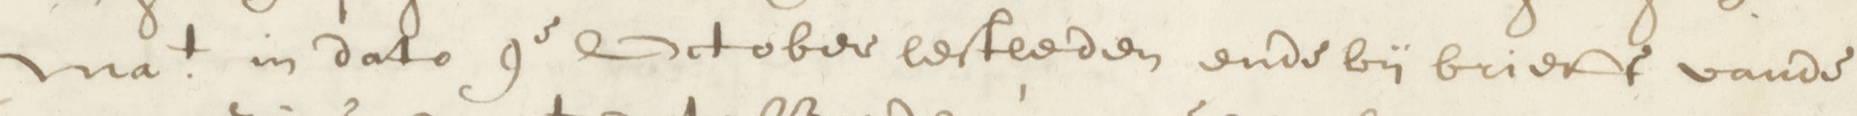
Mat. in dato 9e. October lestleden ende bij brieff vande
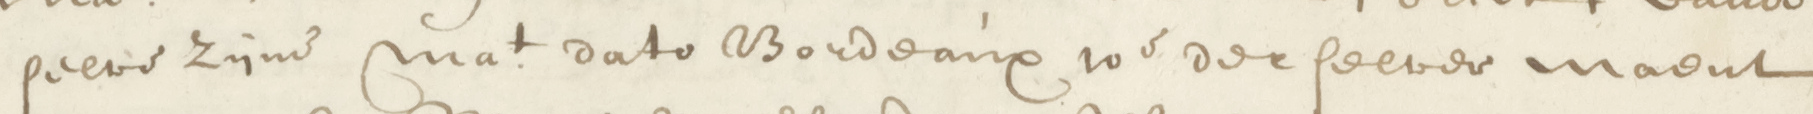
selve zijne Mat. dato Bordeaux 10e derselver maent
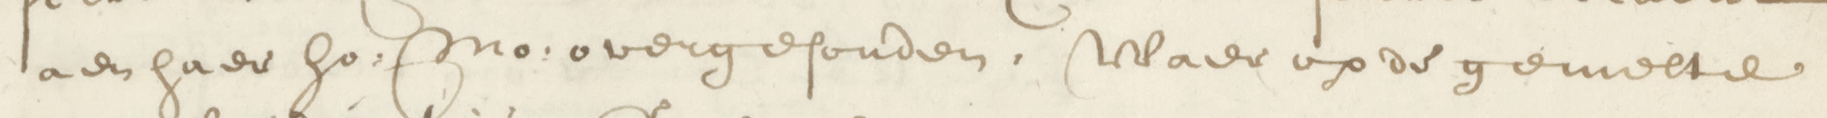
aen haer Ho:Mo: overgesonden. Waer op de gemelte
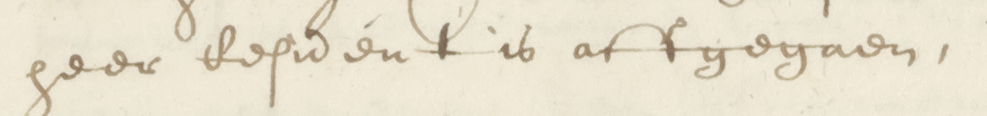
heer Resident is affgegaen.
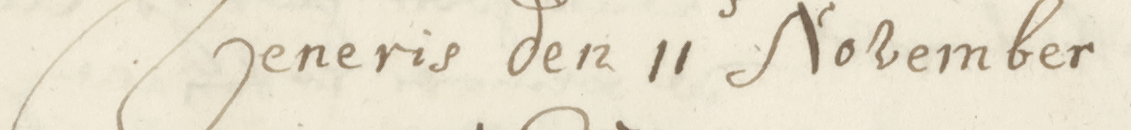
Veneris den 11e November
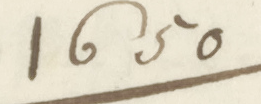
1650
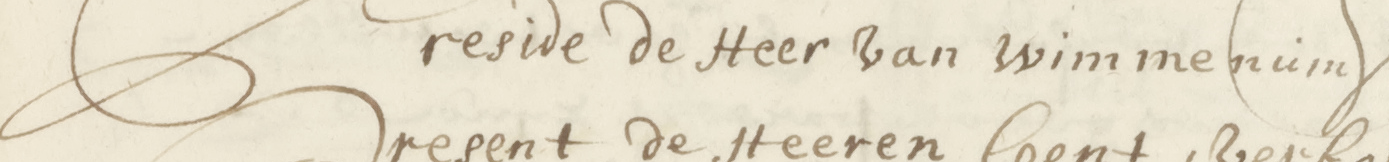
Preside de Heer van wimmenum
